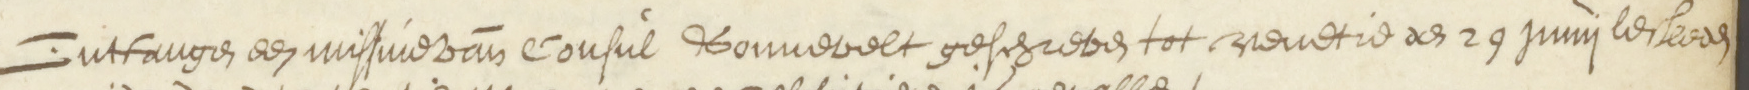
Ontfangen een missiue van Consul Sonnevelt geschreven tot Venetie den 29 junij lestleden
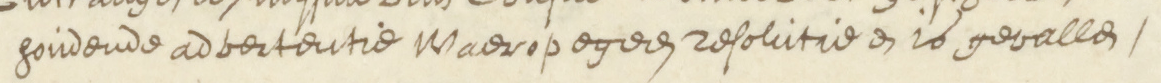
houdende advertentie Waerop egeen resolutie en is gevallen.
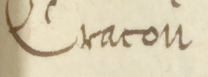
Cracou
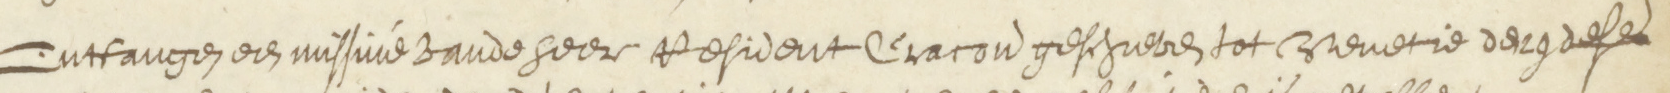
Ontfangen een missiue vande heer Resident Cracou geschreven tot Venetie den 29 deses
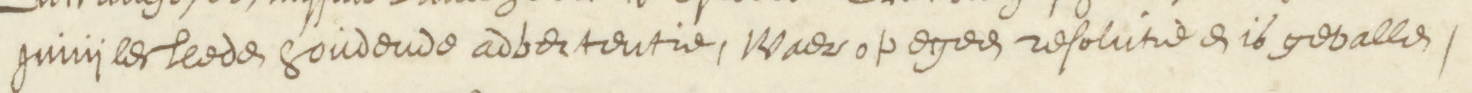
junij lestleden houdende advertentie, Waer op egeen resolutie en is gevallen.
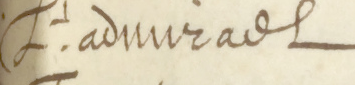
Lt. admirael
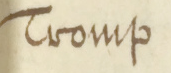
Tromp
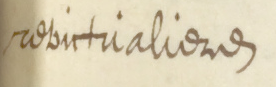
revictualieren
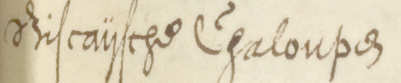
Biscaijsche Chaloupen
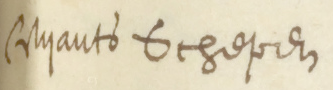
Vyants Schepen
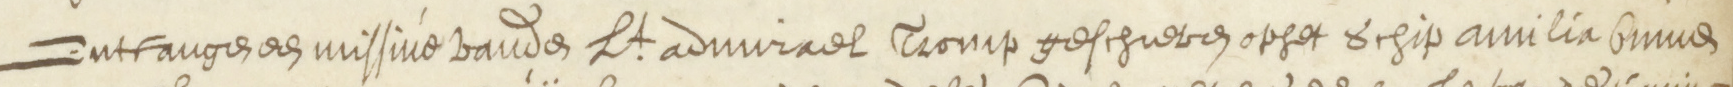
Ontfangen een missiue vanden Lt. admirael Tromp geschreven ophet schip amilia binnen
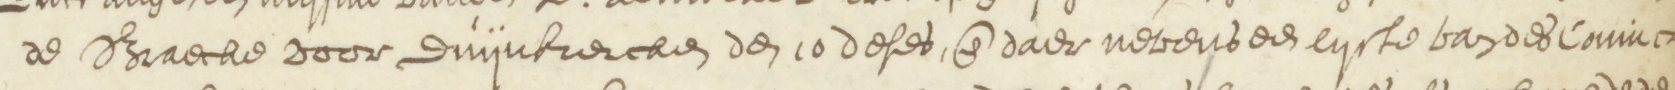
de Braecke voor Duijnkercken den 10 deses, & daer nevens een lyste van des coninc
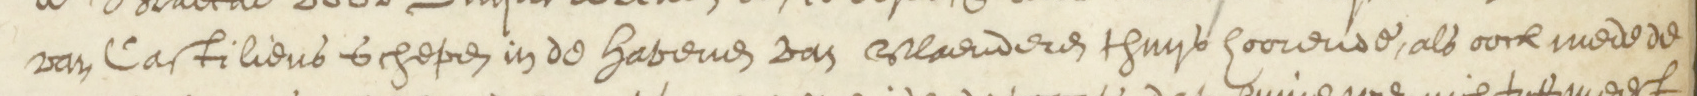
van Castiliens schepen in de havens van Vlaenderen thuys hoorende, als oock mede de
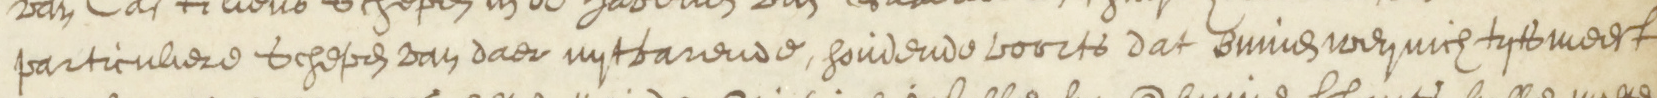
particuliere schepen van daer uytvarende, houdende voorts dat binnen weynich tyts meest
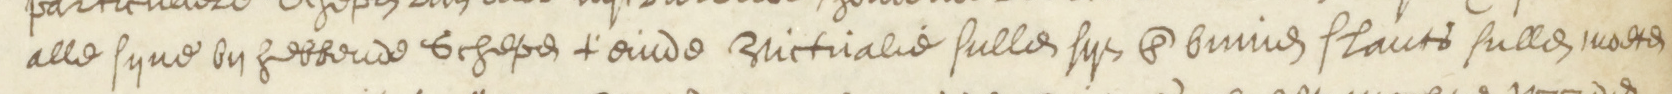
alle syne byhebbende schepen t·einde victualie sullen syn & binnen sLants sullen moeten
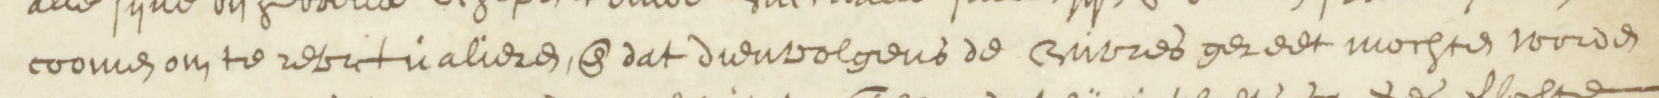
coomen om te revictualieren, & dat dienvolgens de vivres gereet mochten worden
